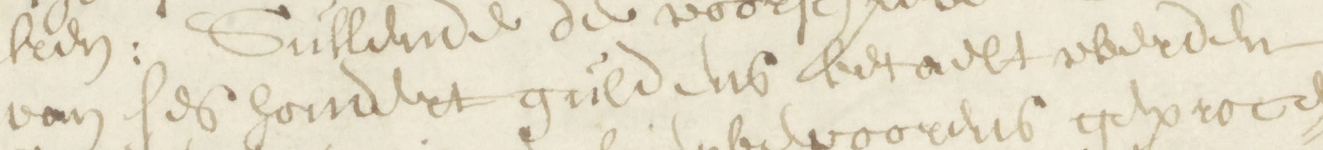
van ses hondert guldens betaelt werden
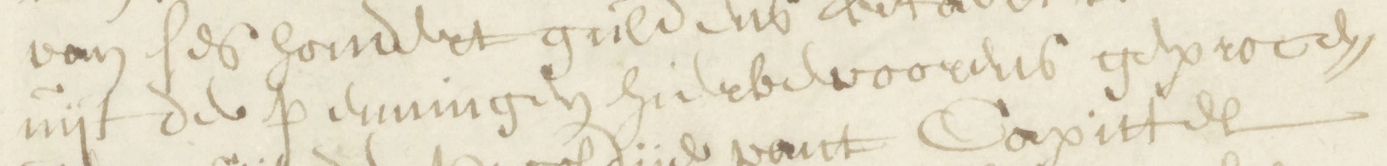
uijt de penningen hierbevoorens geproce„
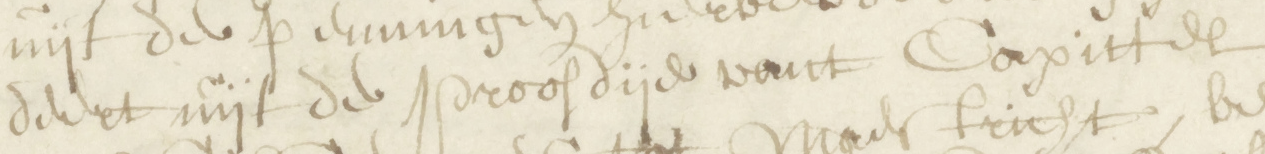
deert uijt de Proosdije vant Capittel
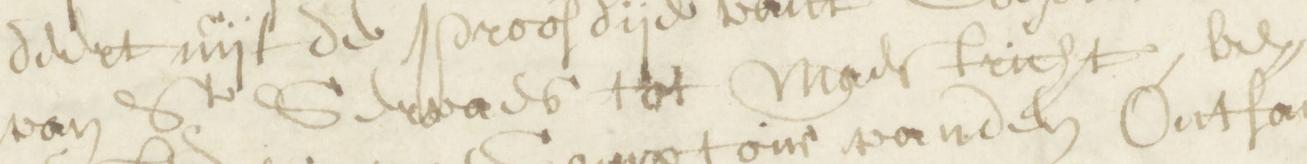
van St. Servaes tot Maestricht, be„
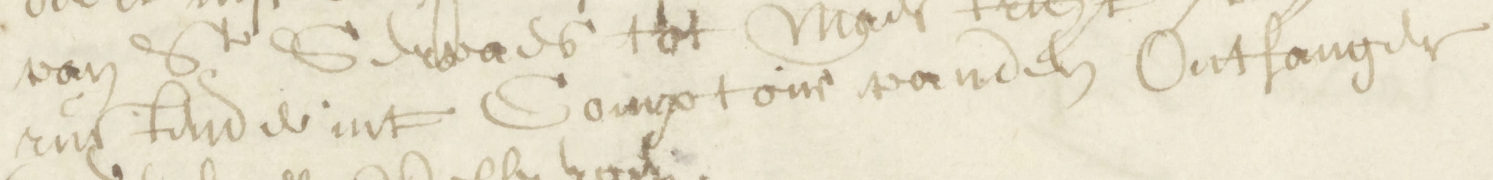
rustende int Comptoir vanden Ontfanger
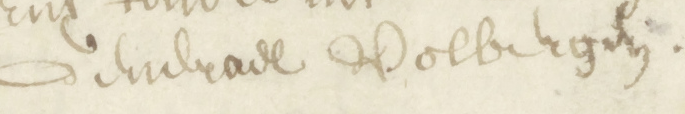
Generael Volbergen.
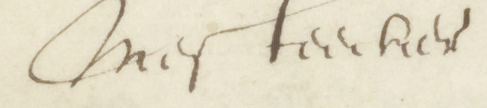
Mesteecker
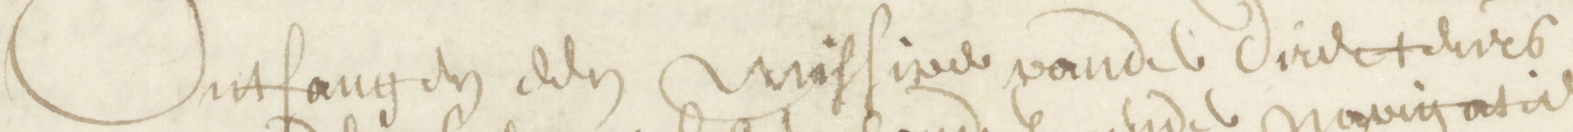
Ontfangen een Missive vande Directeurs
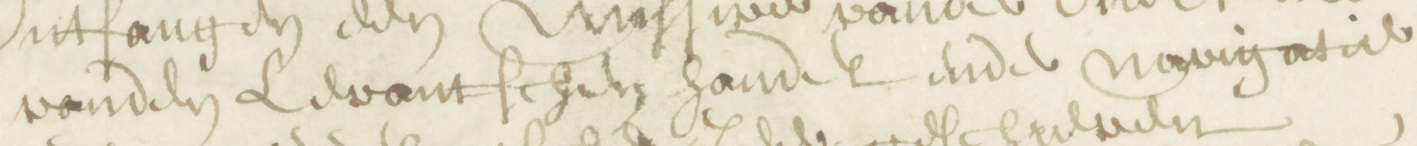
vanden Levantschen handel ende navigatie
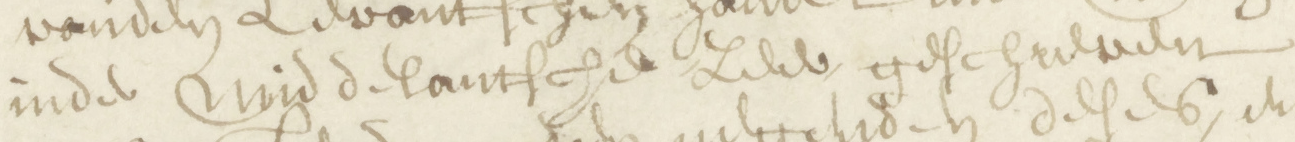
inde Middelantsche Zee, geschreven
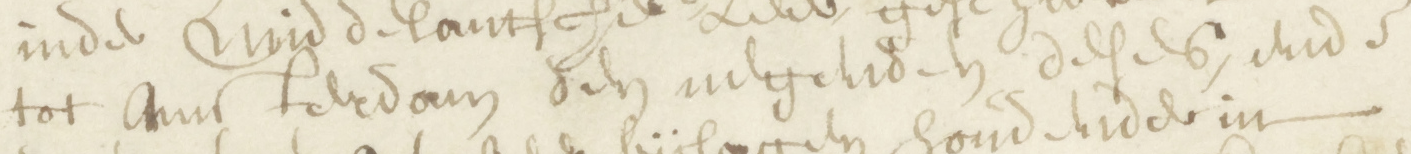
tot Amsterdam den negenden deses, ende
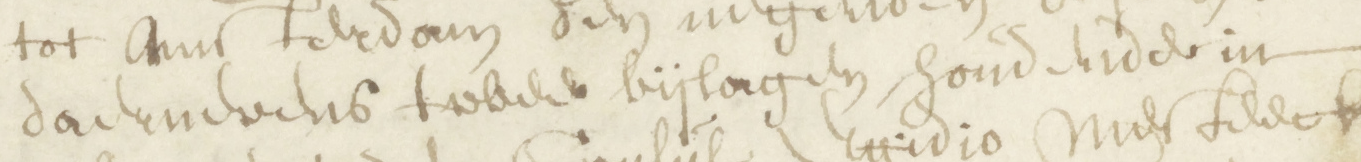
daernevens twee bijlagen, houdende in
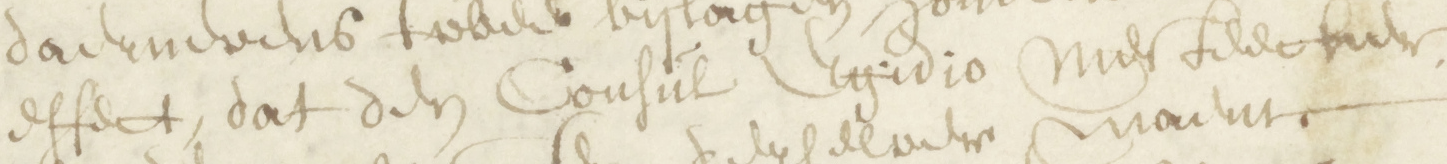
effect, dat den Consul Egidio Mesteecker
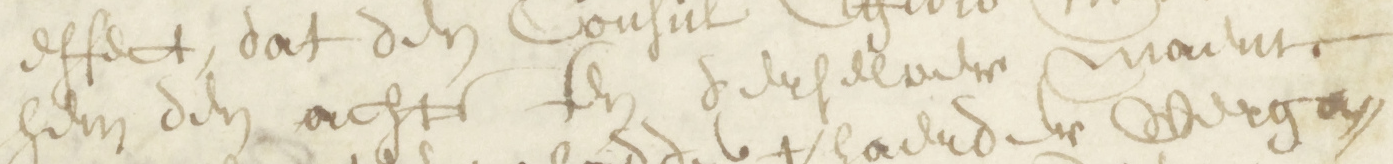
hem den achtsten derselver maent
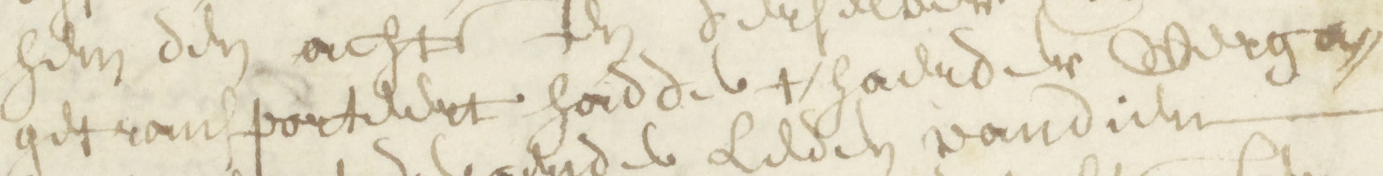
getransporteert hadde t'haerder Verga„
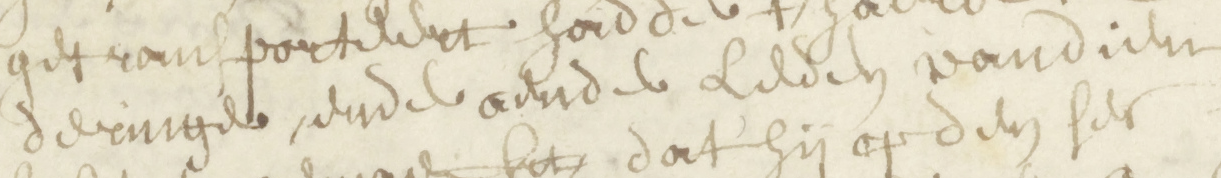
deringe, ende aende Leden vandien
